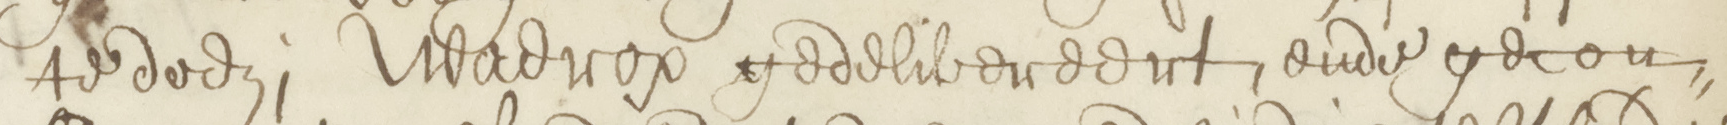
te doen; Waerop gedelibereert, ende gecon„
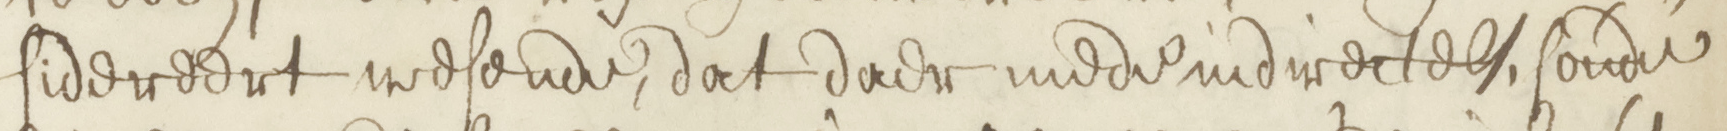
sidereert wesende, dat daer mede indirectel. soude
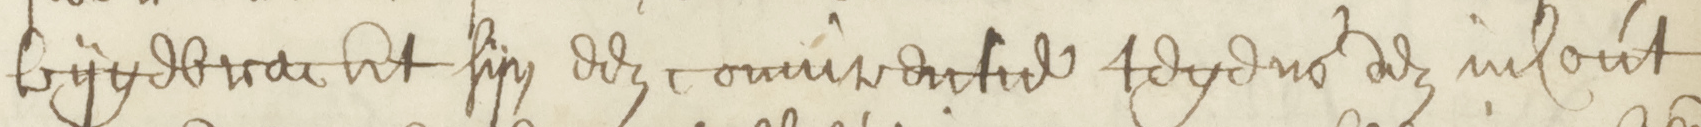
bijgebracht sijn een concurentie tegens den inhout
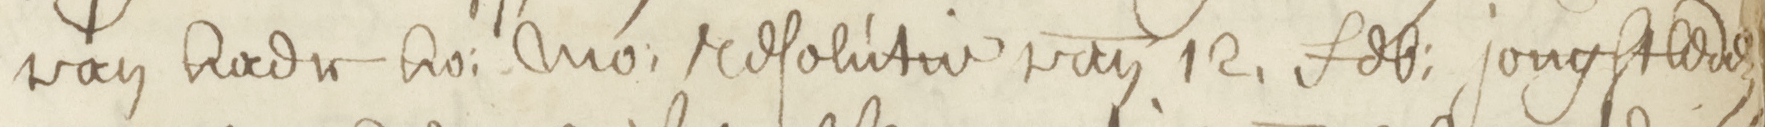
van haer ho:Mo: resolutie van 12. feb: jongstleden,
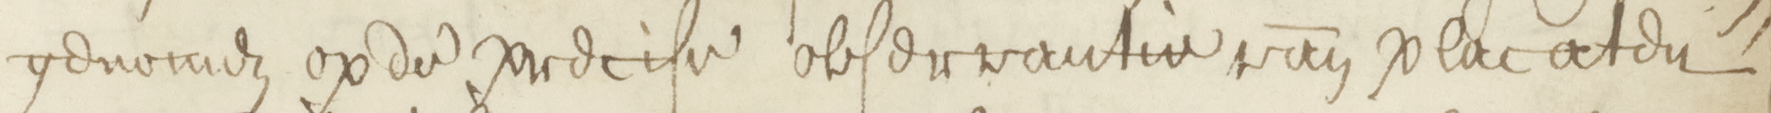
genomen opde precise observantie van placaten
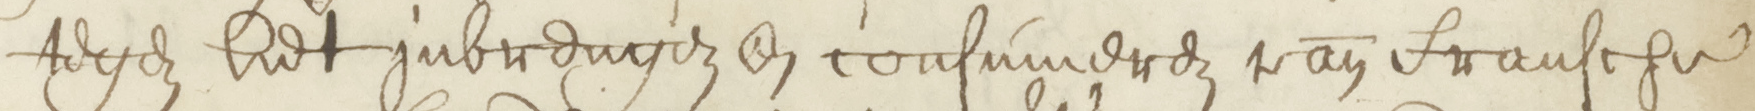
tegen het inbrengen & consumeren van fransche
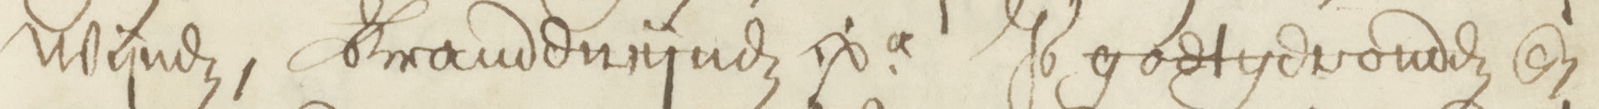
Wijnen, Brandemijnen &a. Is goetgevonden &
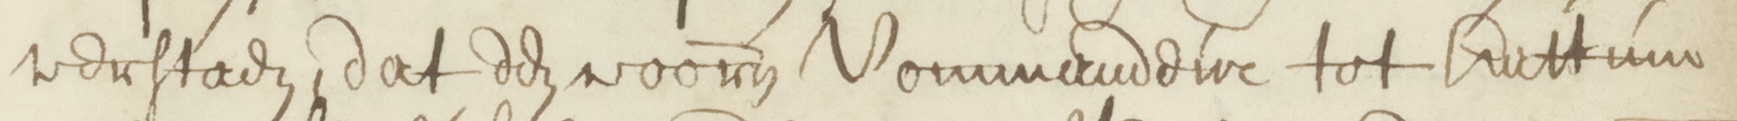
verstaen, dat den voorn Commandeur tot Hattum
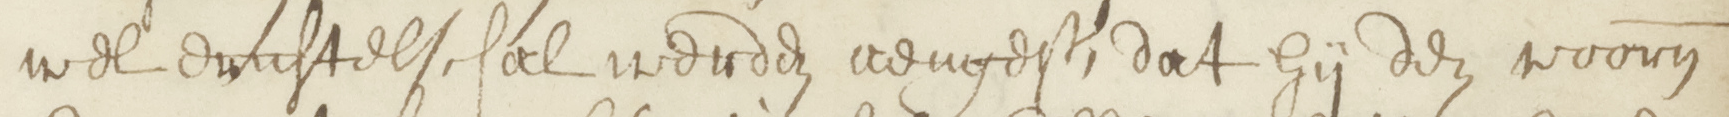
wel ernstel sal werden aengest. dat hij den voorn
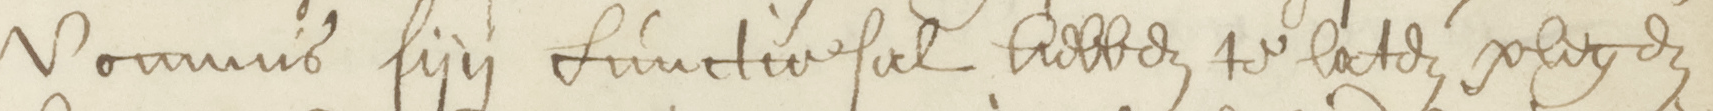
Commis sijn functie sal hebben te laten plegen
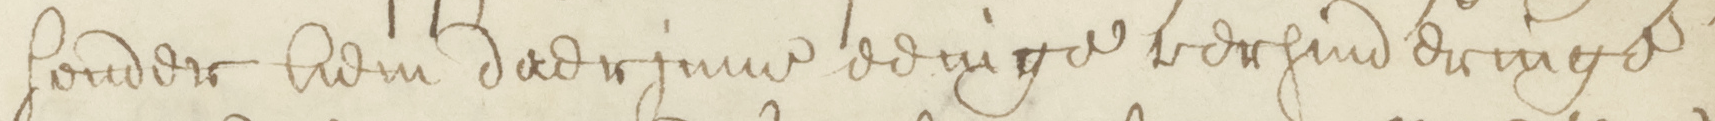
sonder hem daerinne eenige verhinderinge
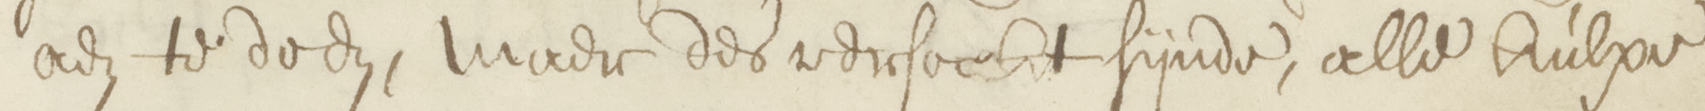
aen te doen, maer des versocht sijnde, alle hulpe
